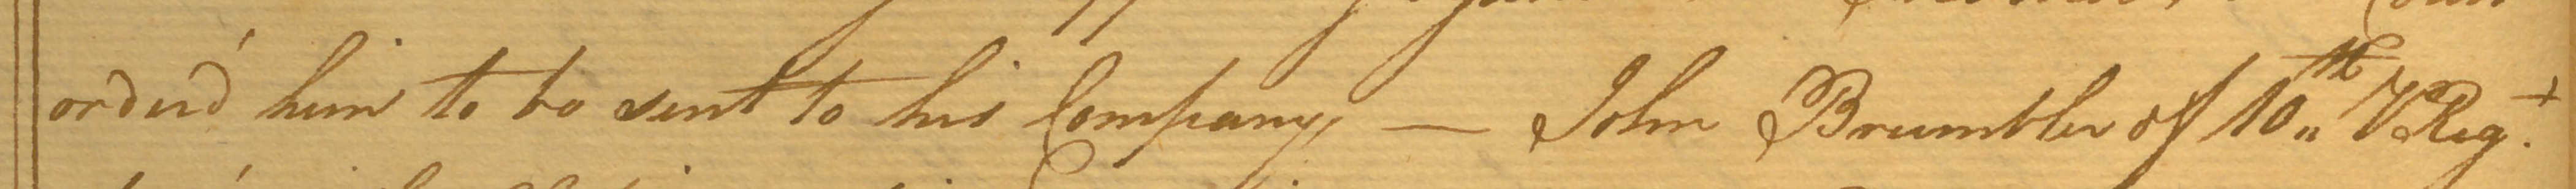order'd him to be sent to his Company- John Brumbler of 10^th. V Reg^t.
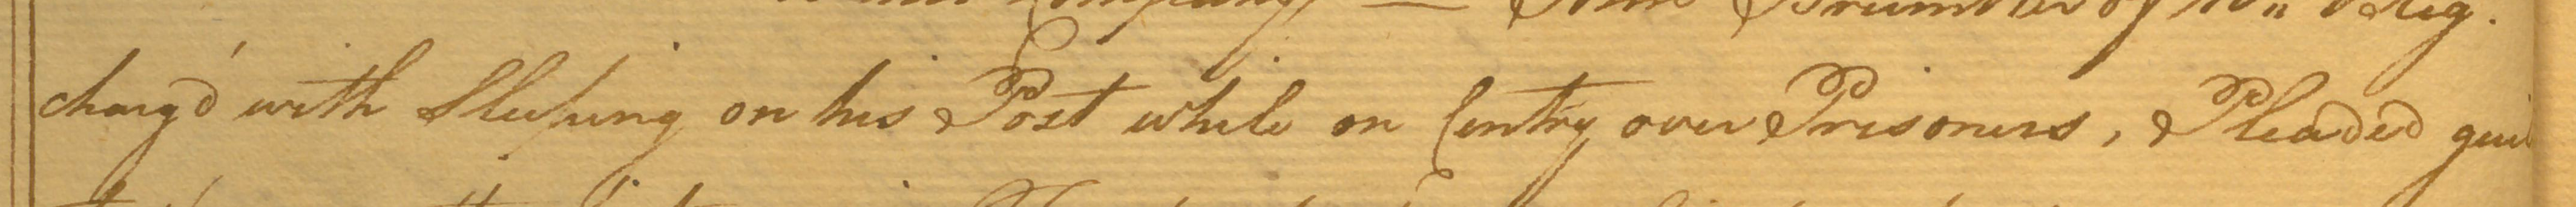charg'd with Sleeping on his Post while on Centry over Prisoners, Pleaded guil
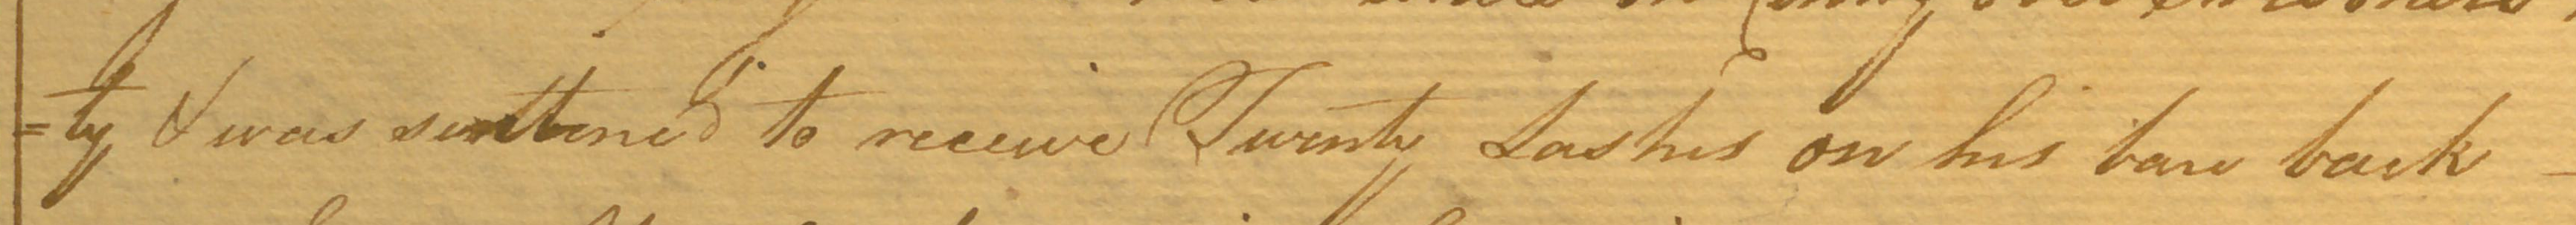-ty & was sentenc'd to receive Twenty Lashes on his bare back-
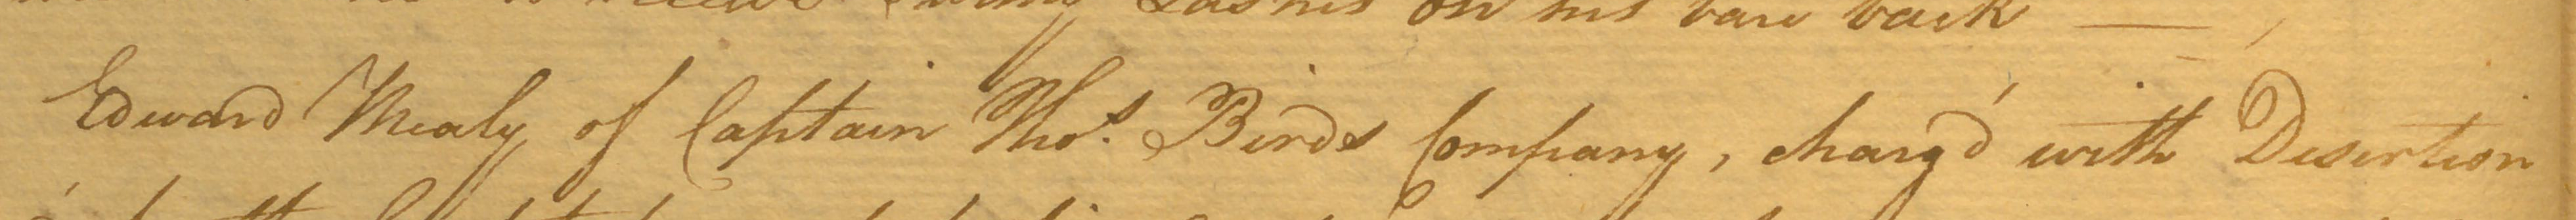Edward Mealy of Captain Tho^s. Birds Company, charg'd with Desertion
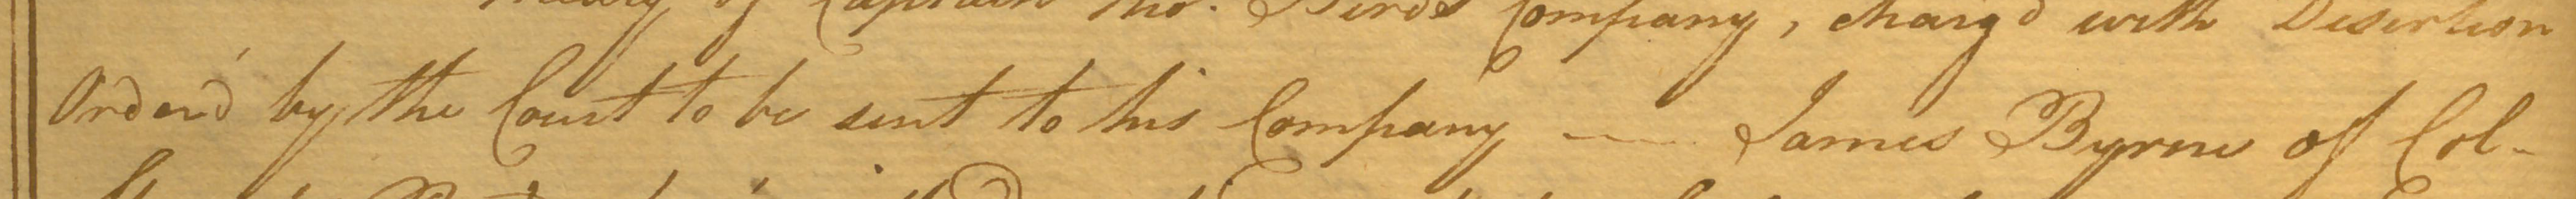Order'd by the Court to be sent to his Company--- James Byrne of Col.
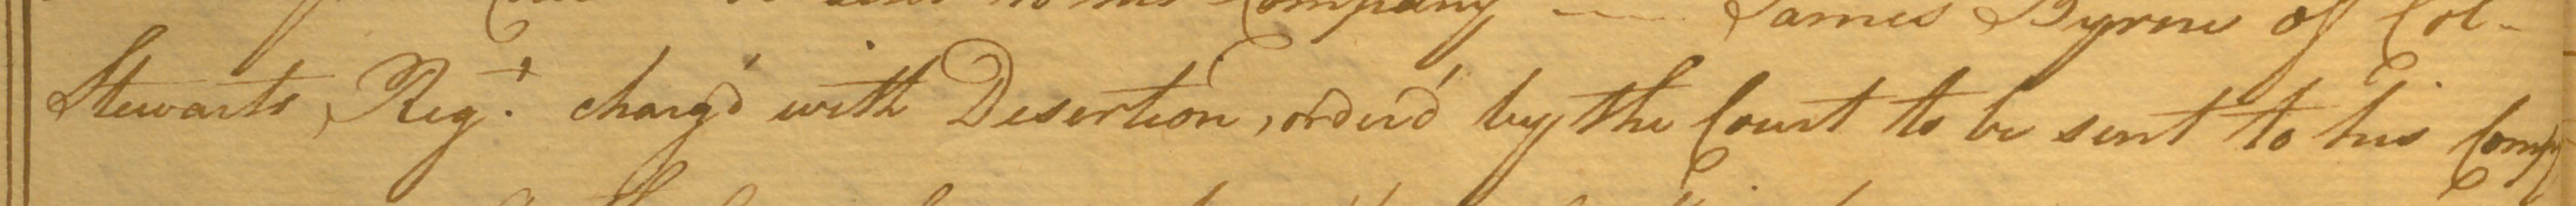Stewarts Reg^t. charg'd with Desertion, order'd by the Court to be sent to his Comp
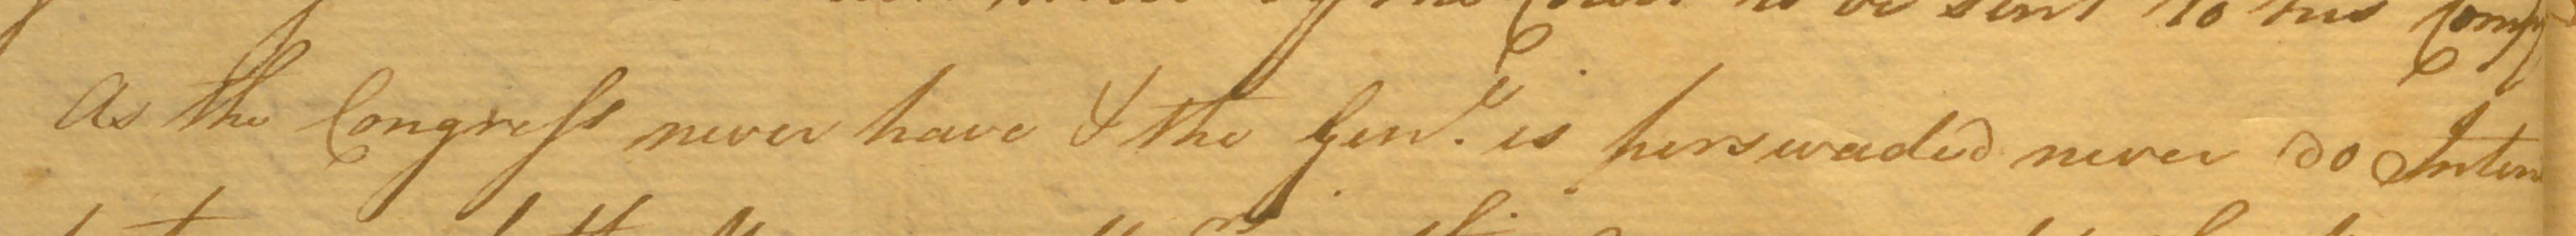As the Congress never have & the Gen^l. is perswaded never do Inten
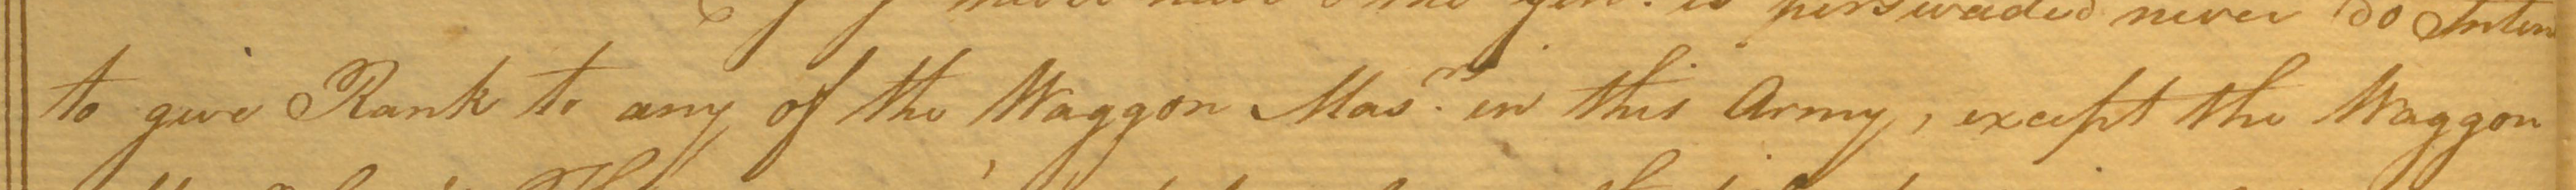to give Rank to any of the Waggon Mas^rs. in this Army, expect the Waggon
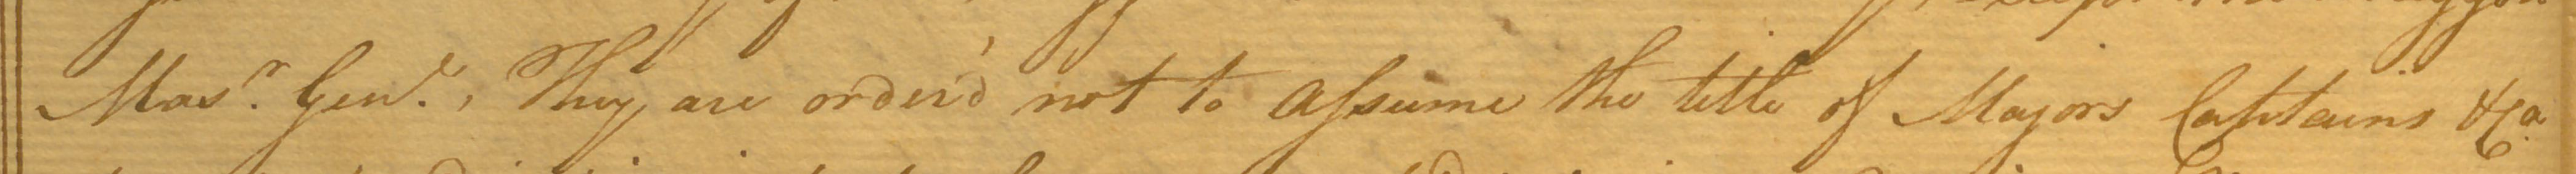Mas^r. Gen^l., They are order'd not to assume the title of Majors Captains &c^a.
